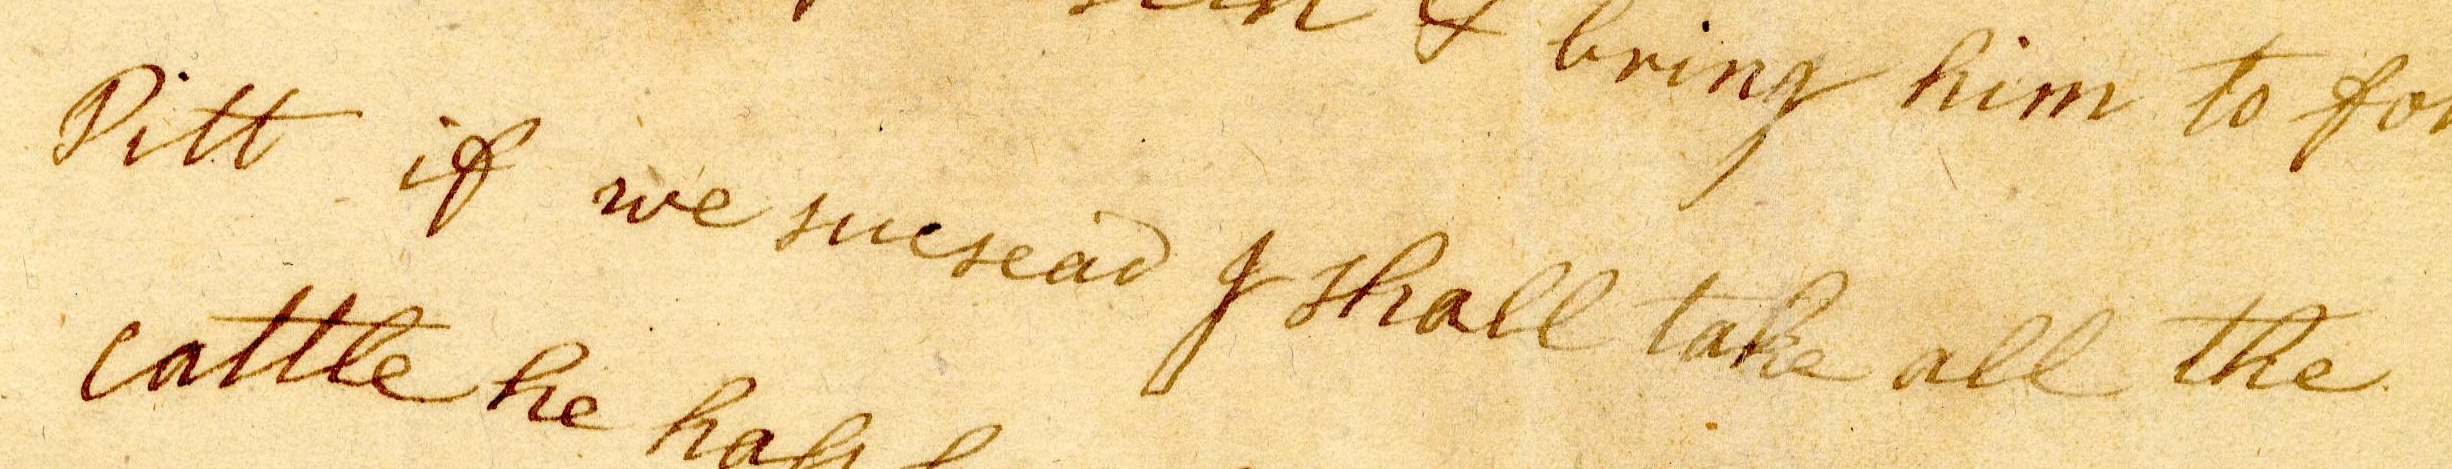Pitt if we sucsead I shall take all the
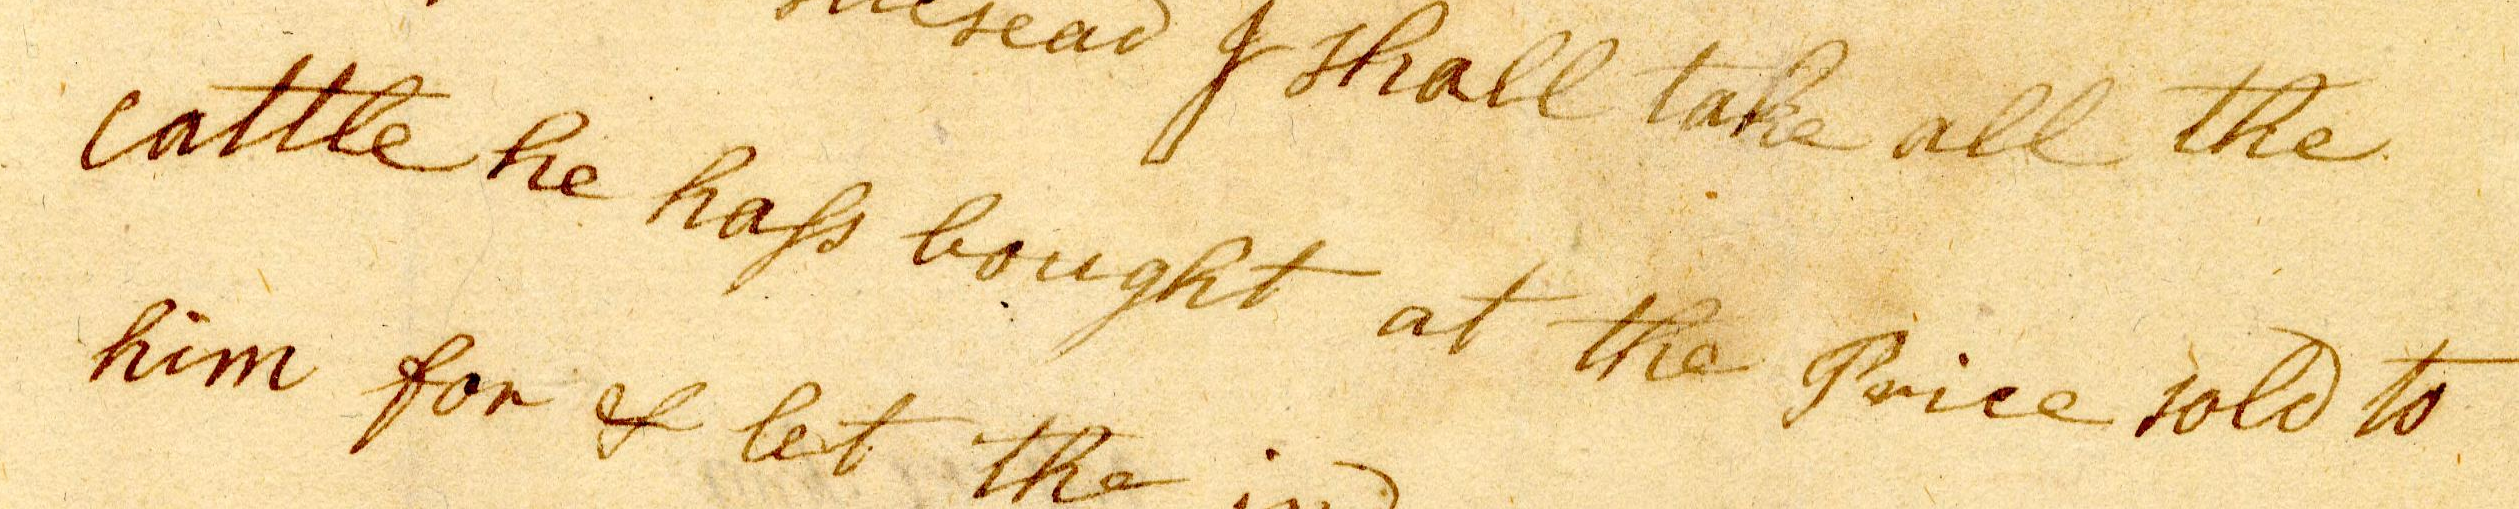cattle he hass bought at the Price sold to
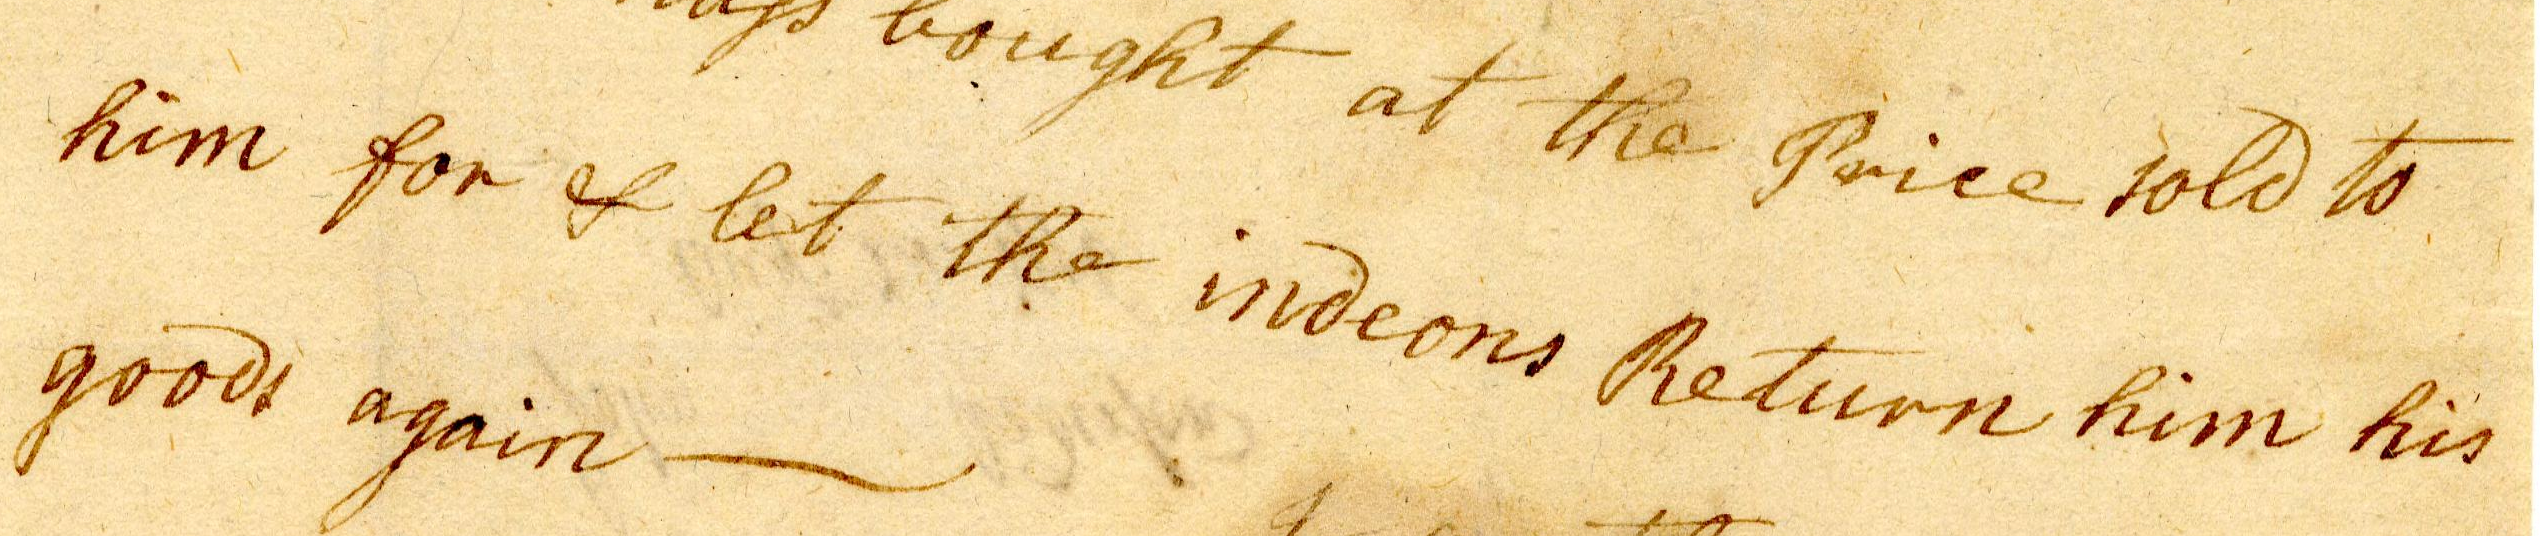him for & let the indeons Return him his
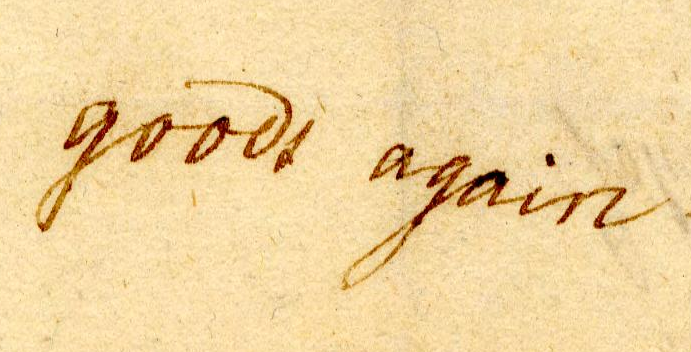goods again-
